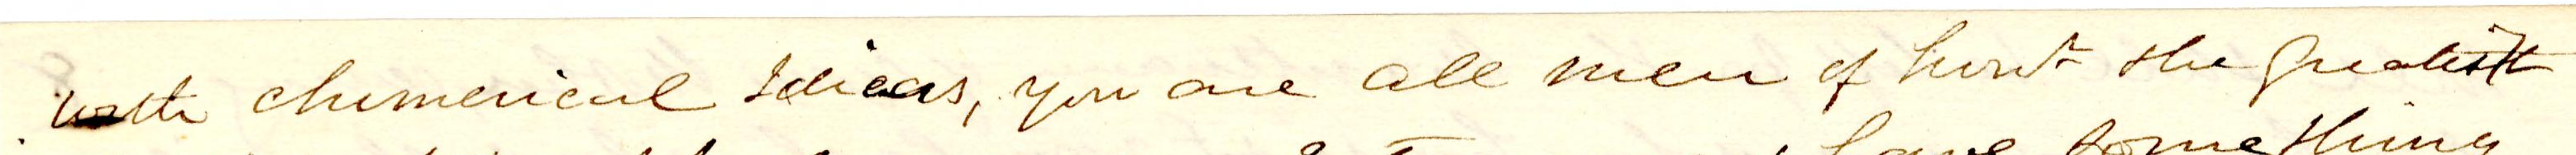with chimerical Ideas, you are all men of hin^t the Greatest
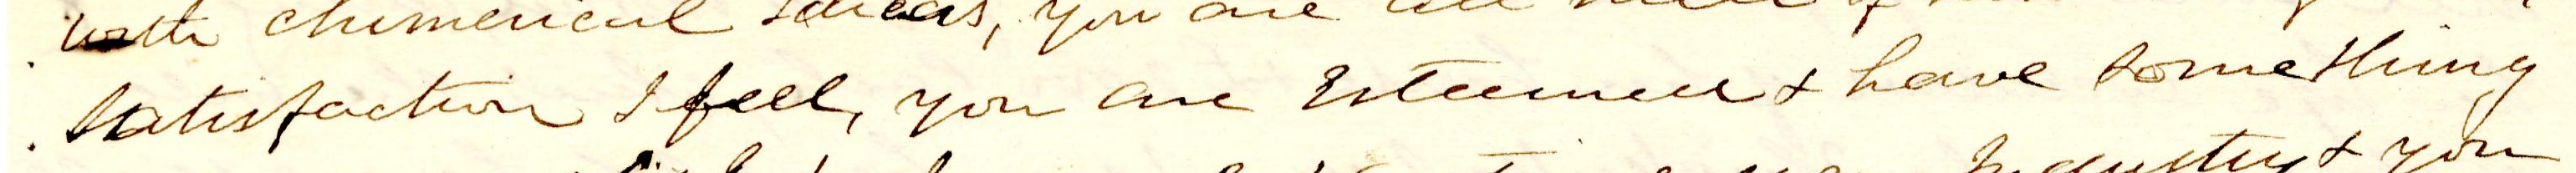satisfaction I feel, you are Esteemed & have something
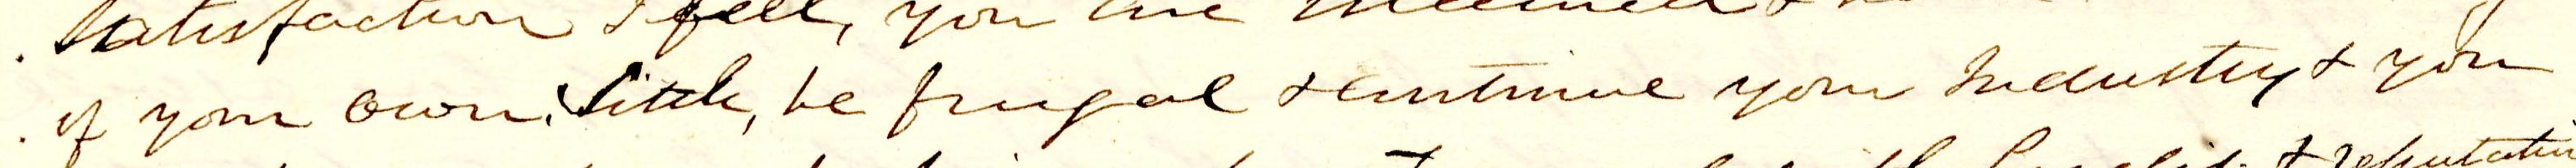of your own little, be frugal & continue your Industry & you
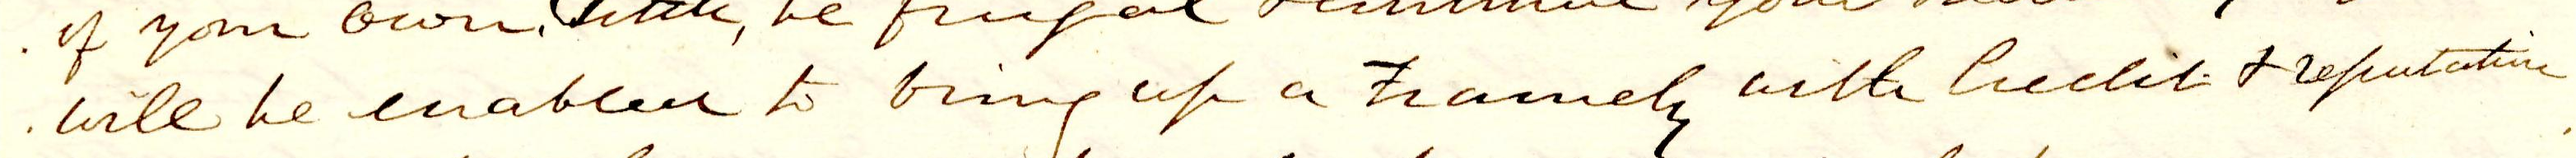will be enabled to bring up a Famely with Credit & reputation
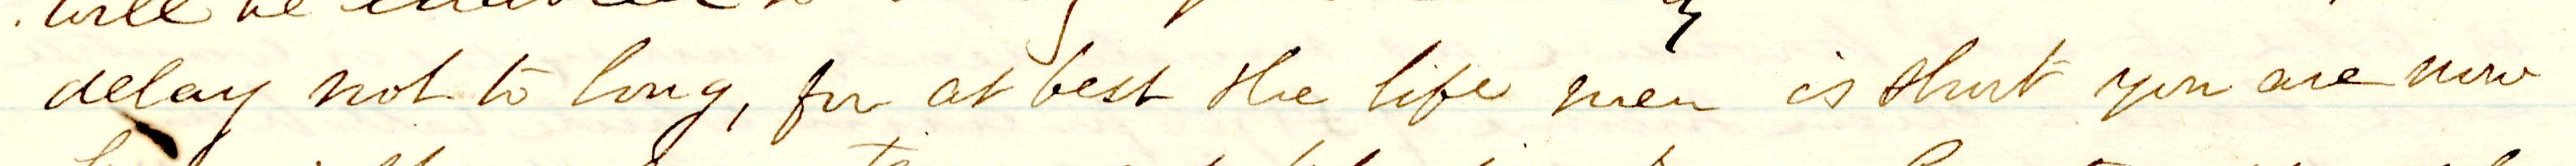delay not to long, for at best the life men is short you are now
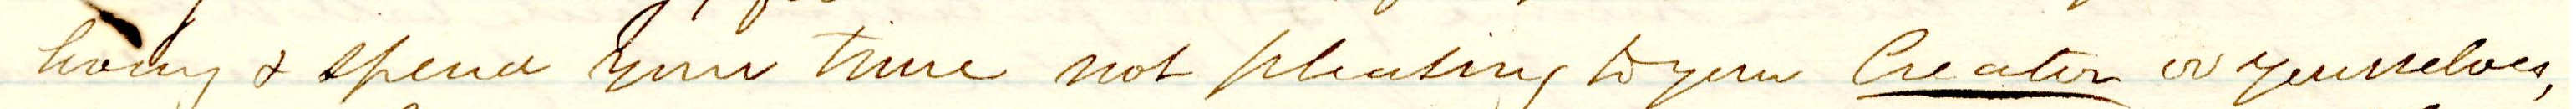hardy & spend your time not pleasing to your Creator or yourselves,
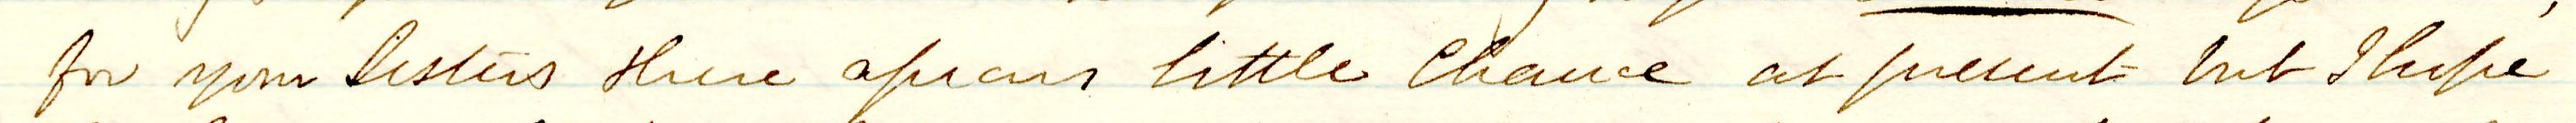for your Sisters there apears little Chance at present but I hope
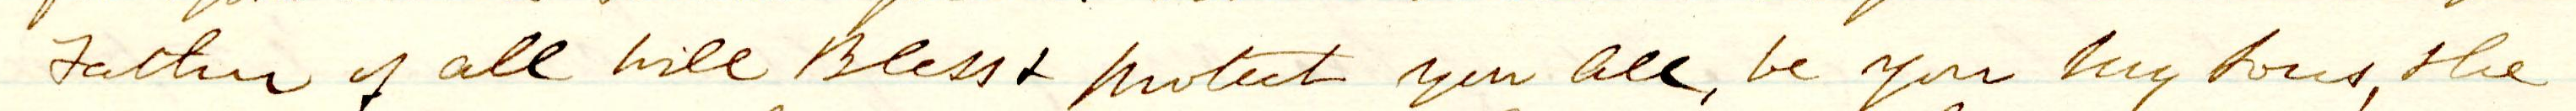Father of all will bless & protect you all, be you my sons, the
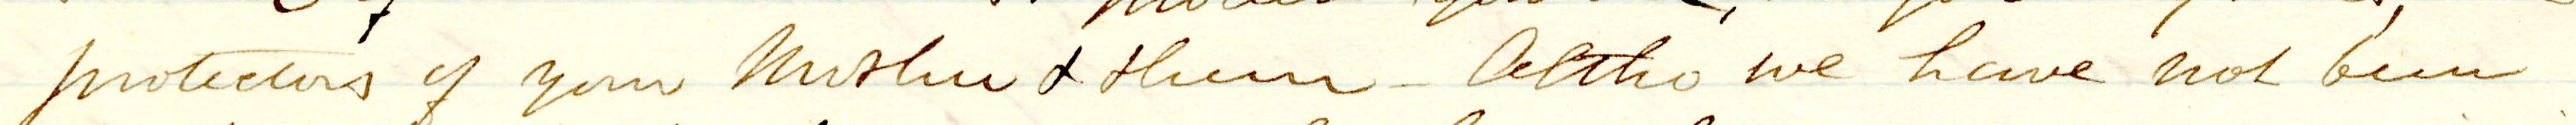protectors of your mother & them- Altho we have not been
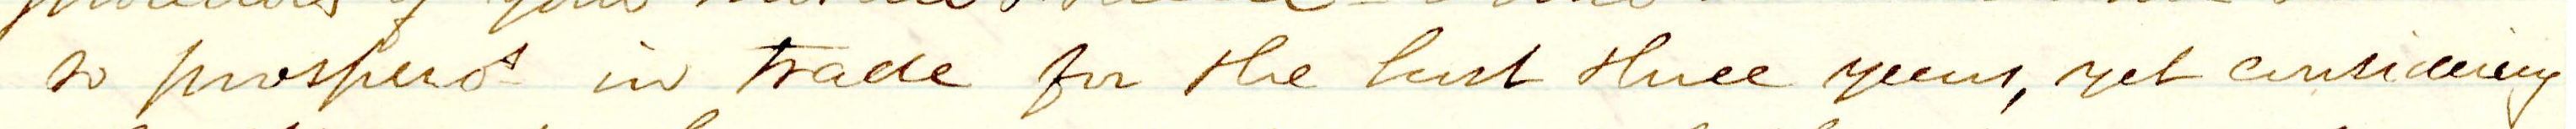so prospero^s in trade for the last three years, yet considering
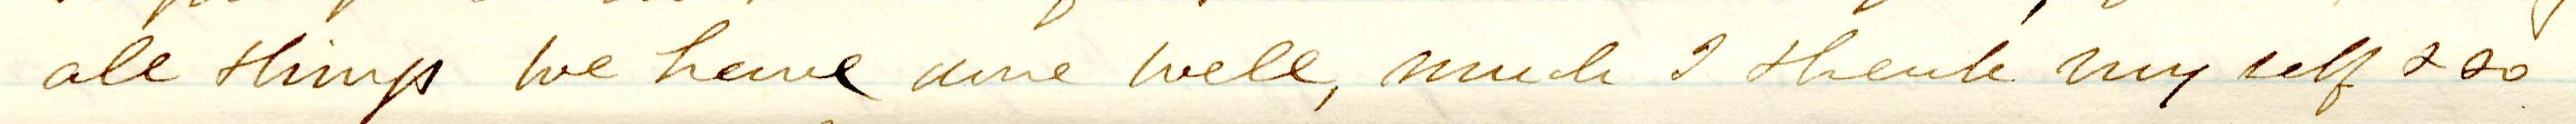all things we have done well, much I think my self & so
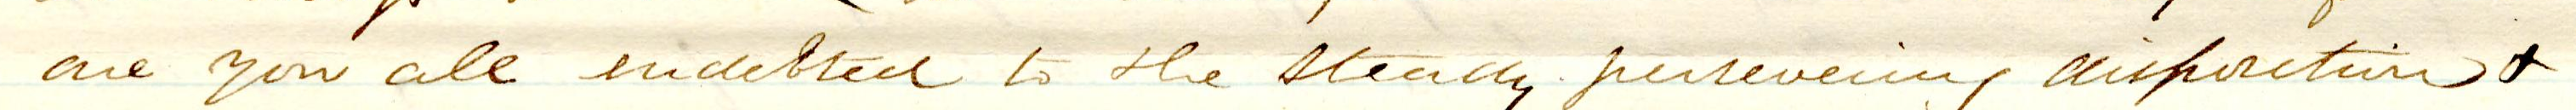are you all indebted to the steady preserving disposition &
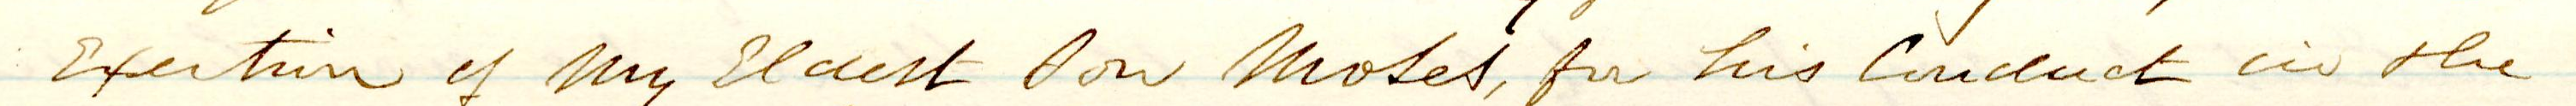Exertion of my Eldest Son Moses, for his Conduct in the
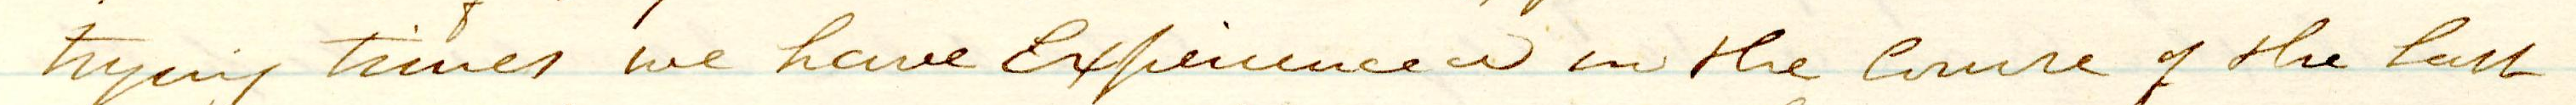trying times we have Experienced in the course of the last
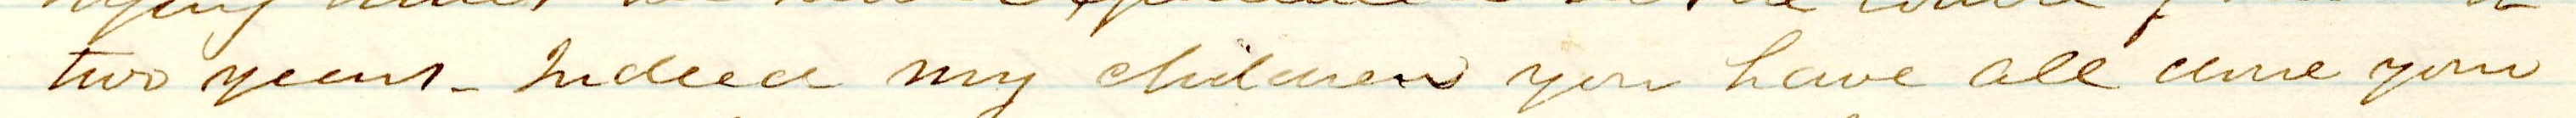two years- Indeed my Children you have all done your
